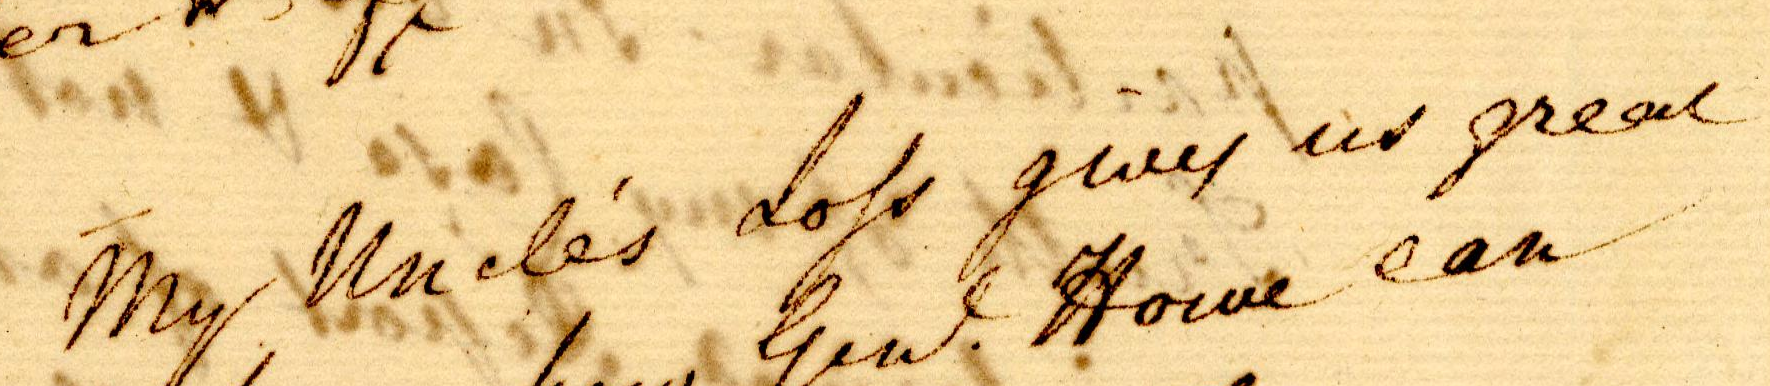My Uncle's Loss gives us great
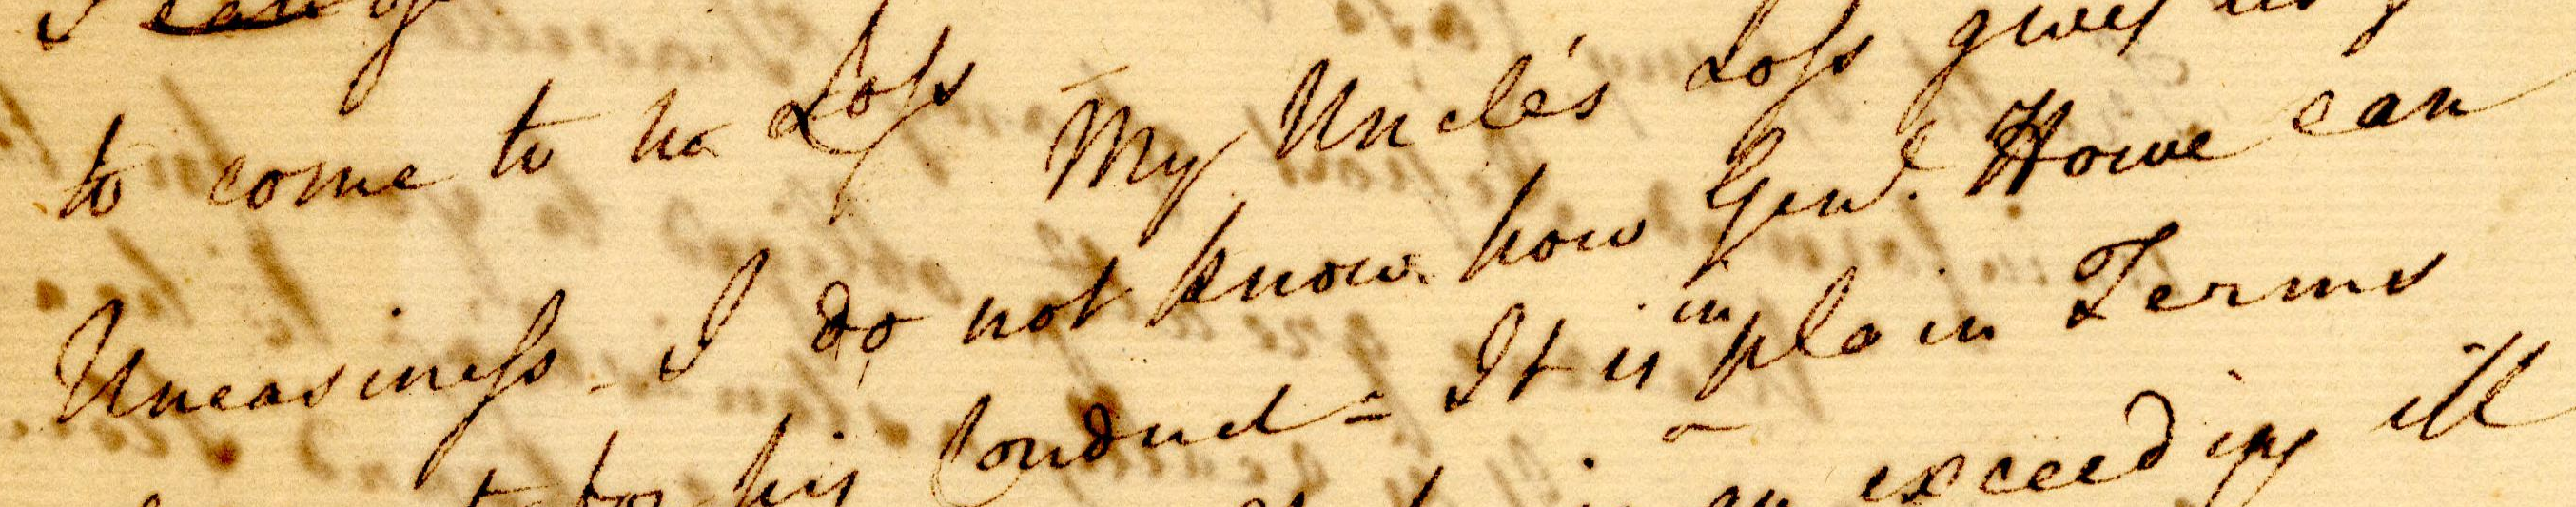Uneasiness. I do not know how Gen^l Howe can
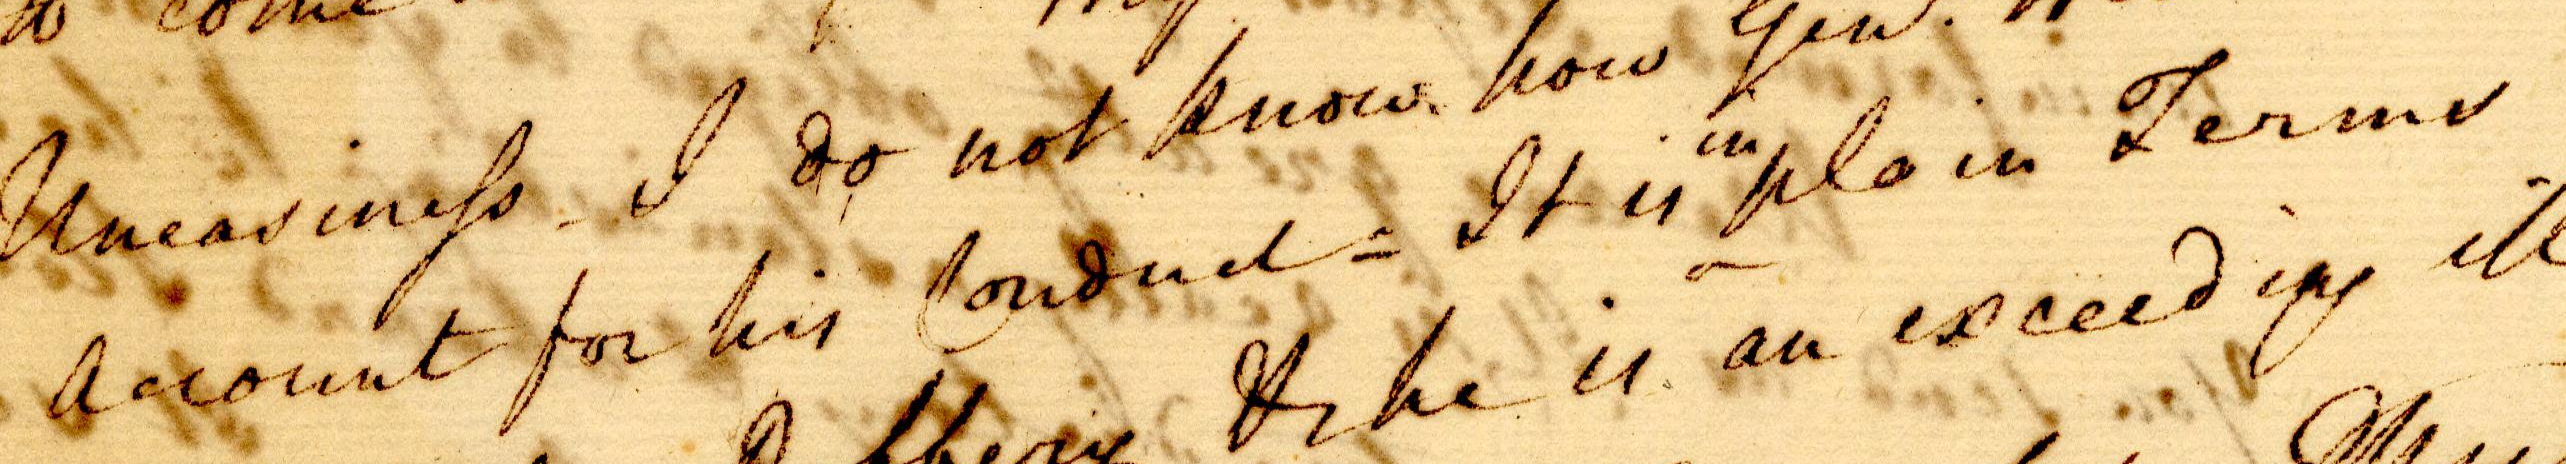Account for his Conduct- It is ^in plain Terms
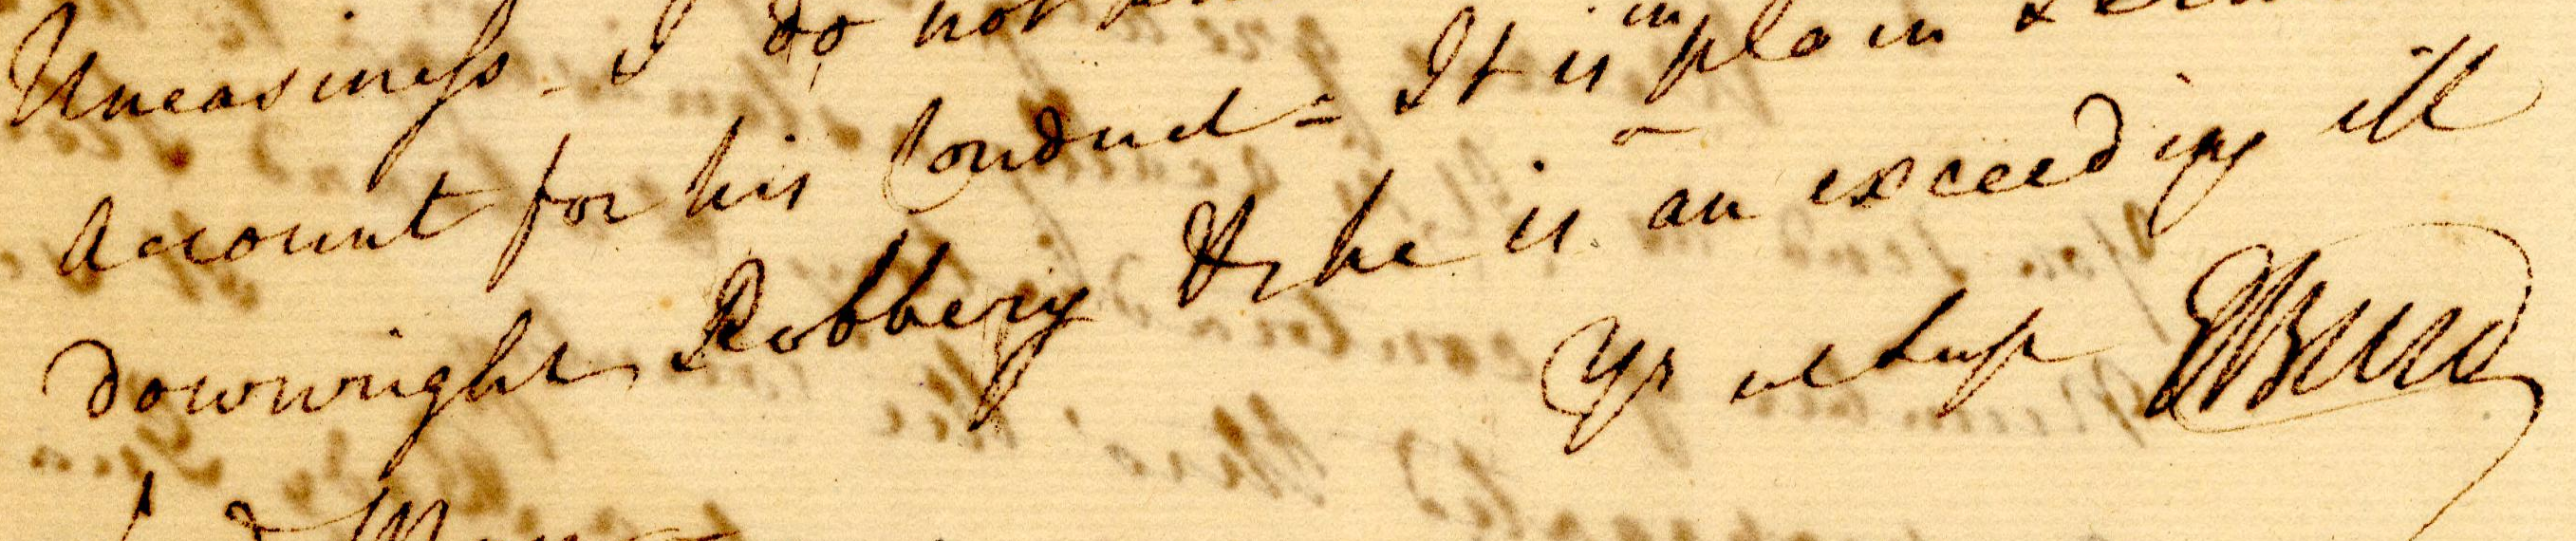downright Robbery & he is an exceeding ill
